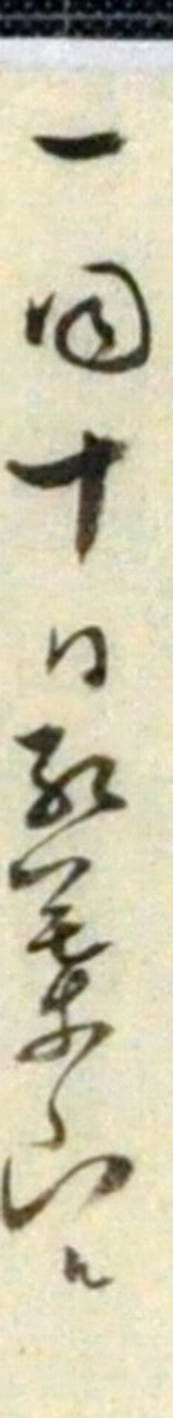一同十日紅葉山江
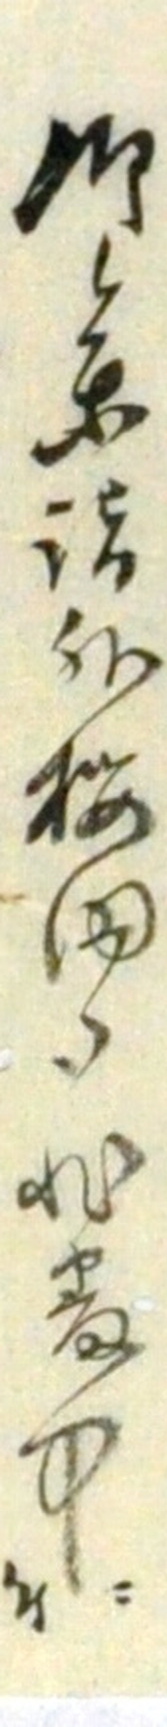御参詣外桜田御非番中ニ付
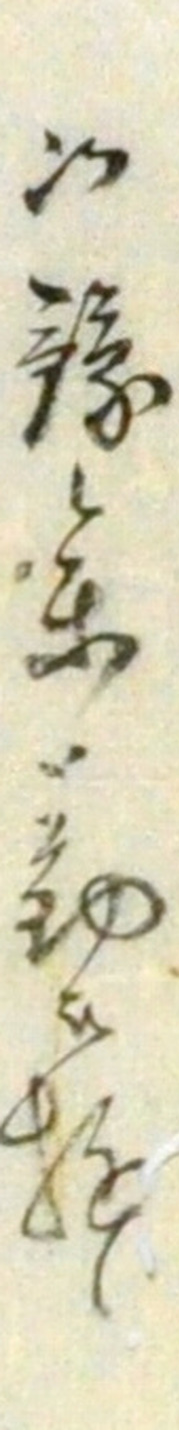御予参御勤被遊候
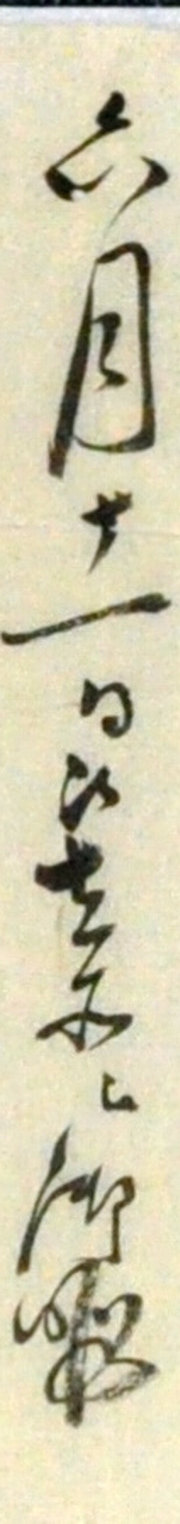六月十一日御在所江御暇
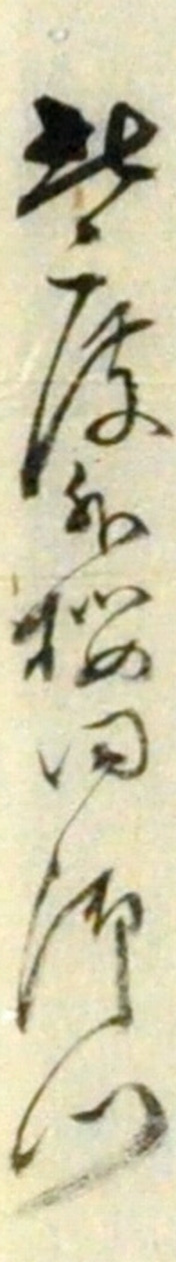此度外桜田御門
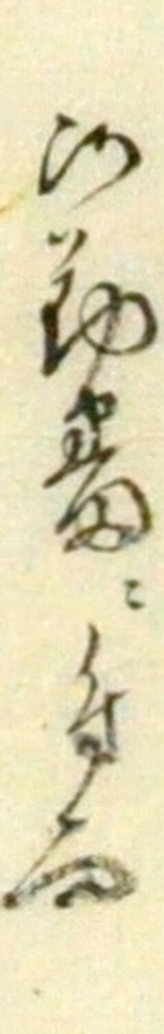御勤番ニ付而
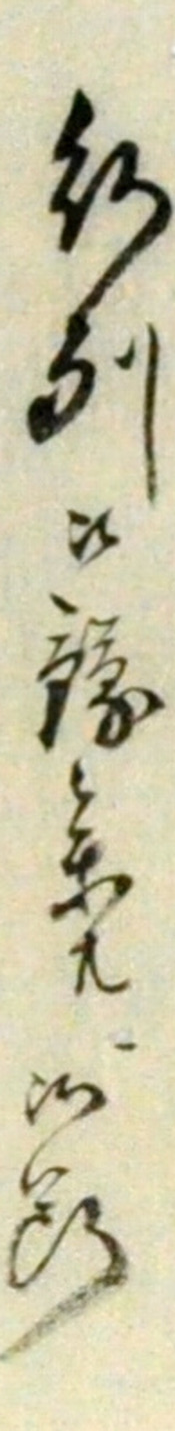行列御予参共ニ御断
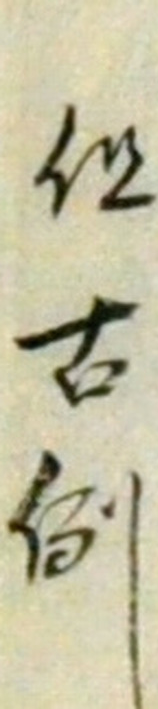但古例

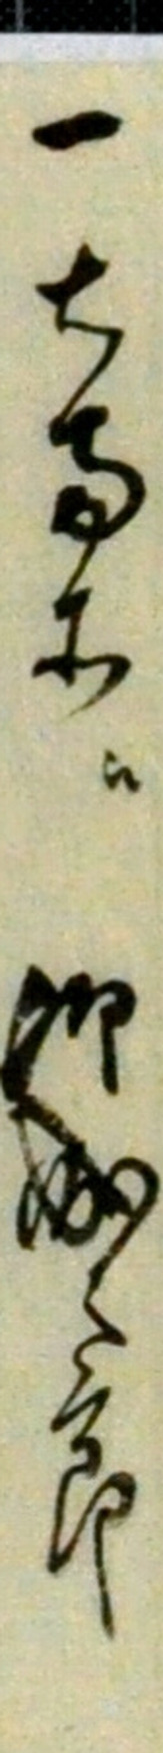一右両所江御成之節
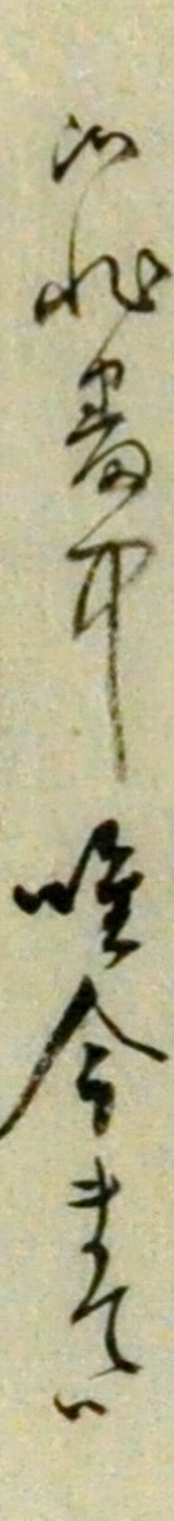御非番中唯今まてハ
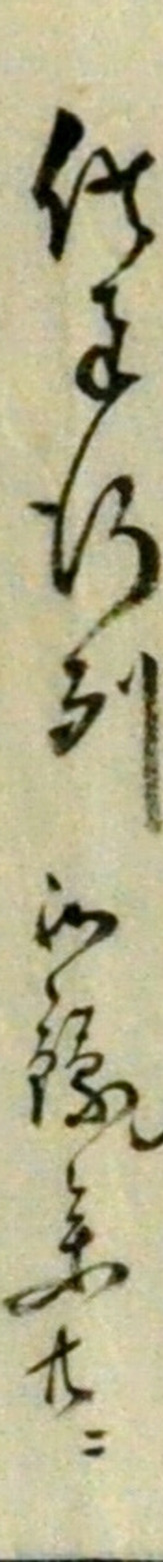供奉行列御予参共ニ
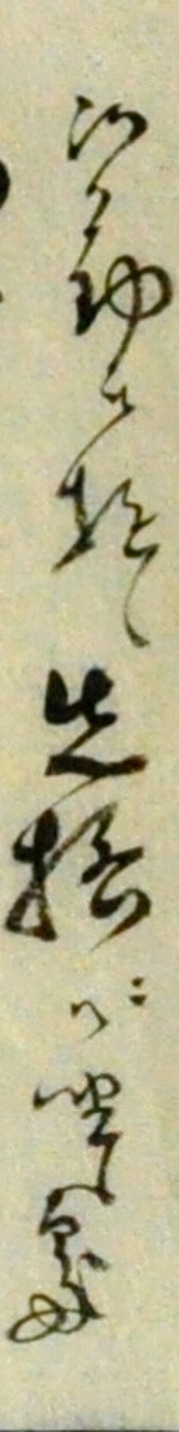御勤被遊候先格ニ御坐候処
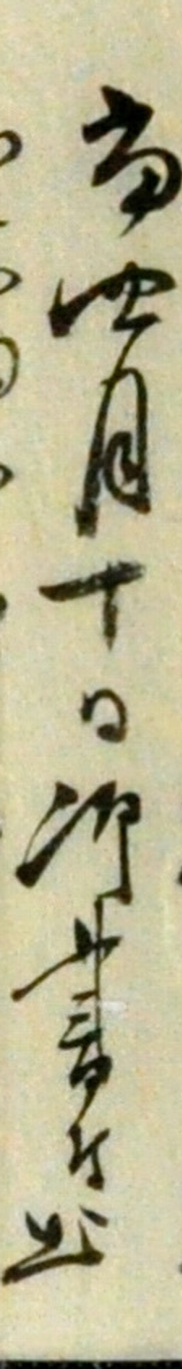当四月十日御書付出
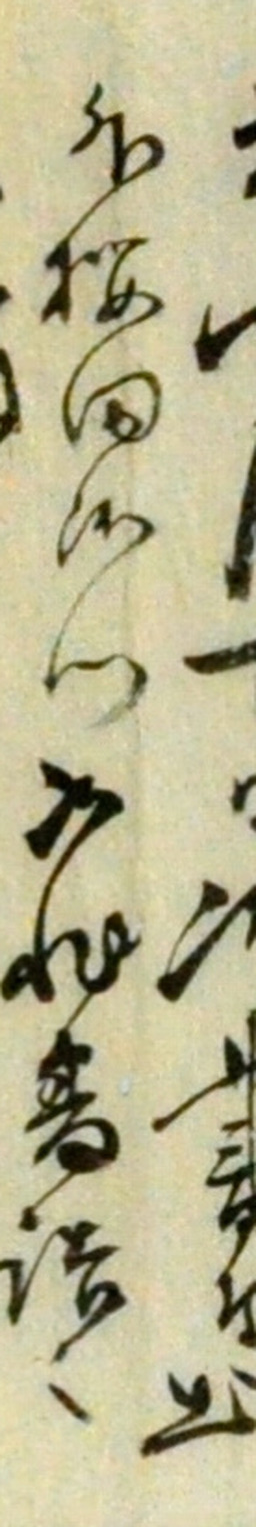外桜田御門御非番詰之
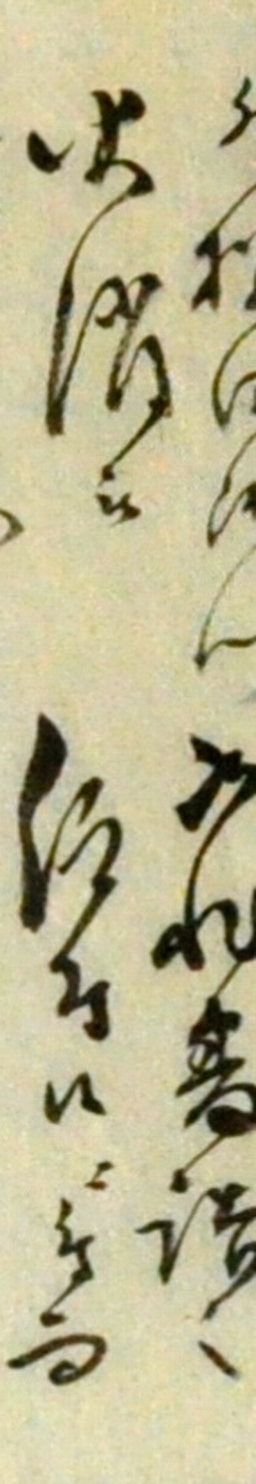火消被仰付候ニ付而
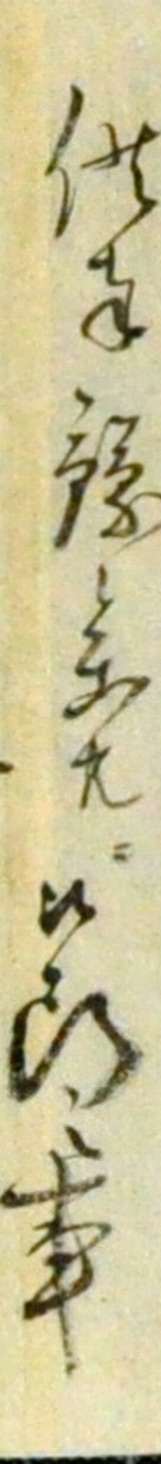供奉予参共ニ御断之事
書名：覚
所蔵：伊那市立高遠町図書館・合同会社AMANE
